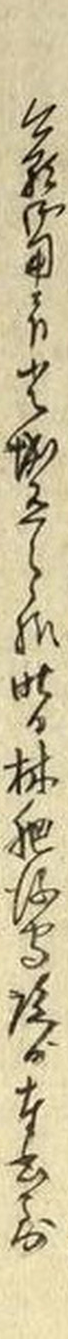今朝御用ニ付登城有之候様昨日林肥後守殿ゟ奉書到
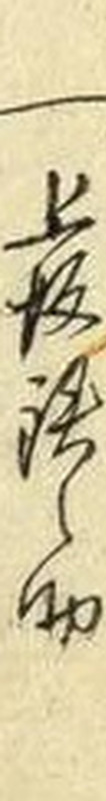上坂鉄之助
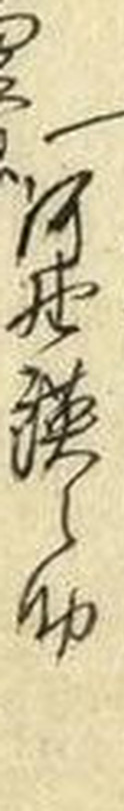河野鍈之助
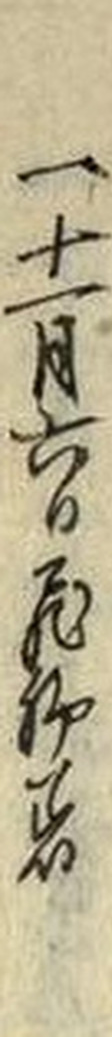一十一月六日飛脚着
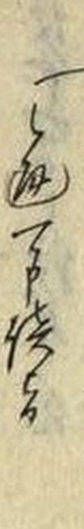之通可申談旨

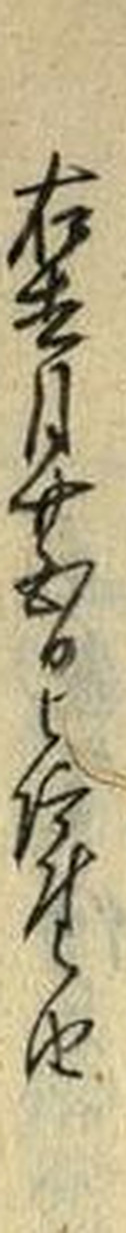右去月廿五日被仰付候由
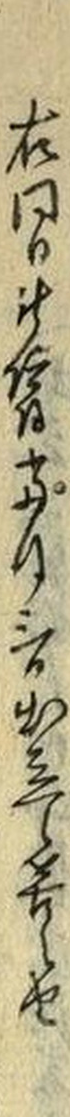右同日被仰付当月三日出立之筈之由
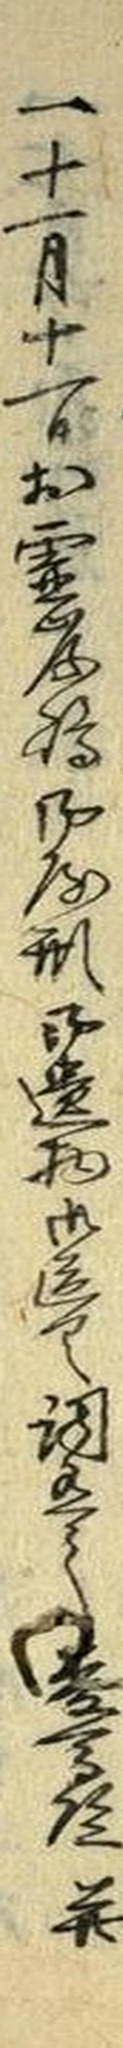一十一月十一日於霊岸嶋御屋形御遺物御道具調有之藤馬殿并
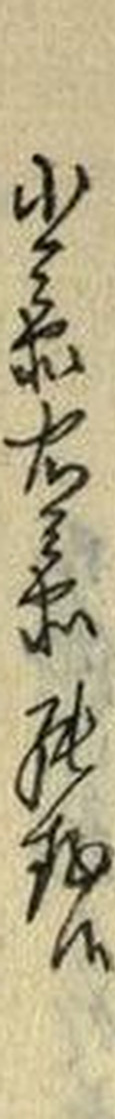小兵衛忠兵衛罷越候
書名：少傅日録抄（斉善付側向頭取日記、江戸并道中、初入在国、逝去後…
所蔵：福井県文書館 Fukui Prefectural Archives
